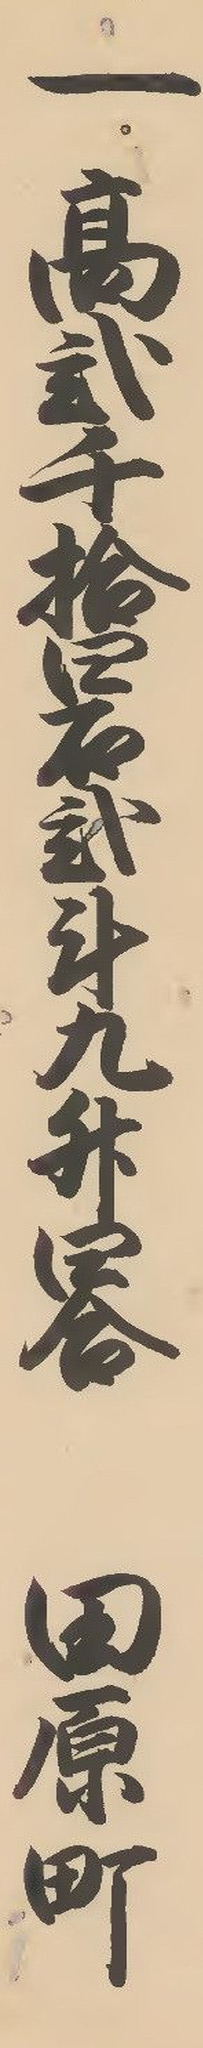一高弐千拾四石弐斗九升四合田原町
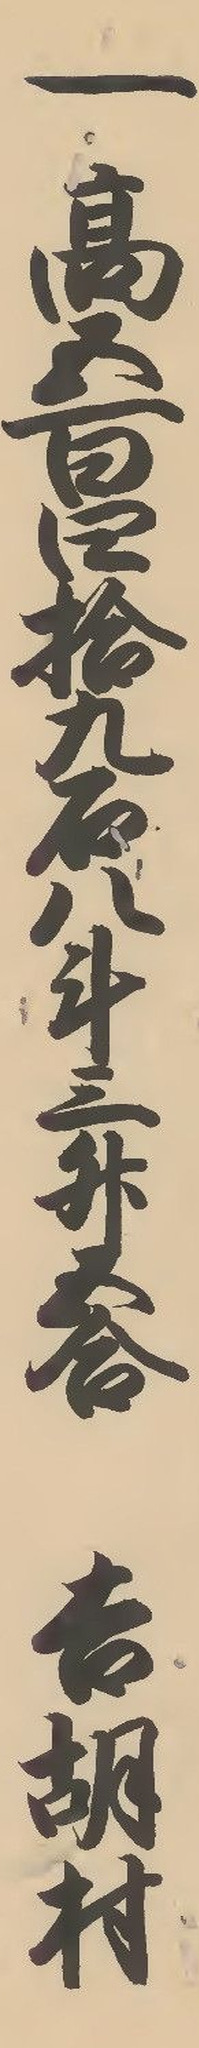一高五百四拾九石八斗三升五合吉胡村
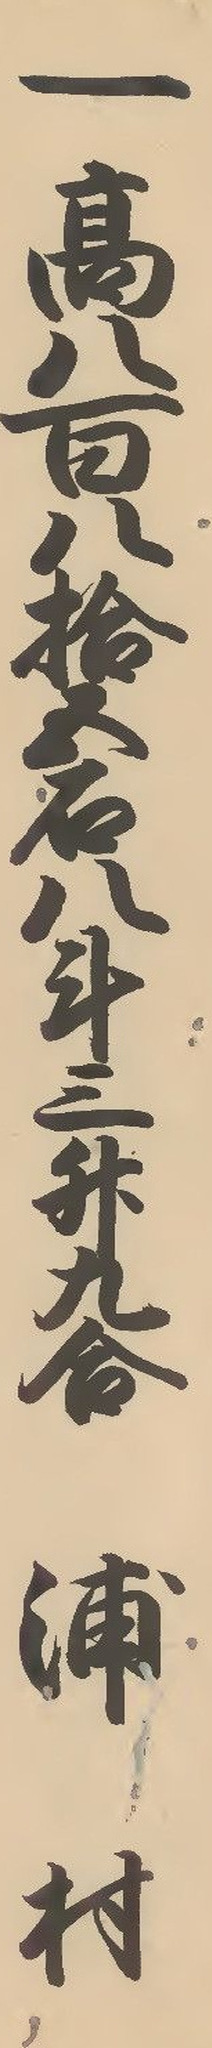一高八百八拾五石八斗三升九合浦村
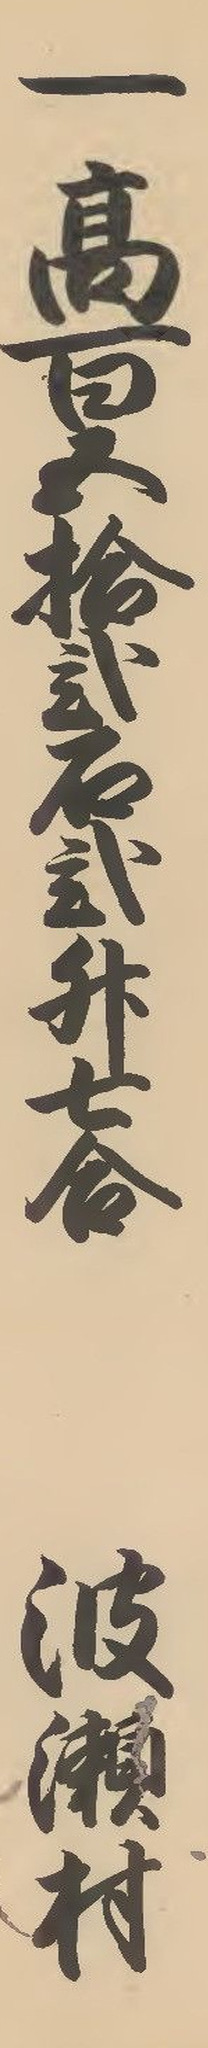一高百五拾弐石弐升七合波瀬村
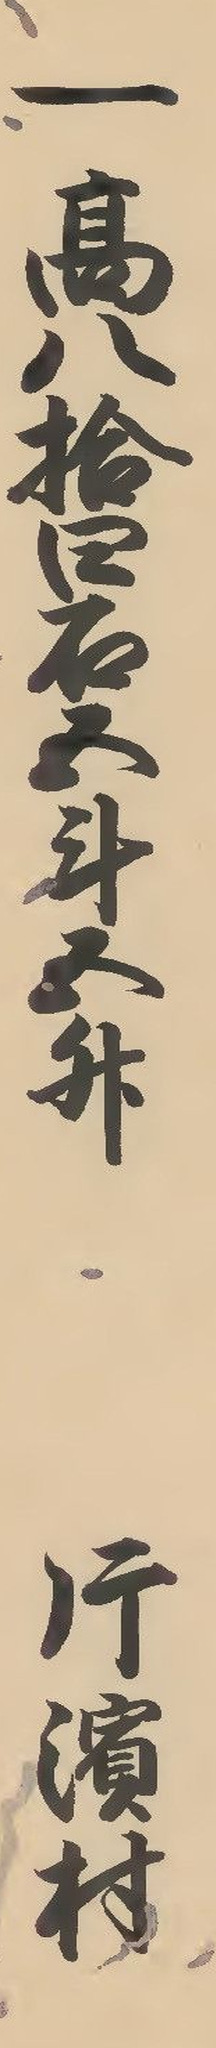一高八拾四石五斗五升片浜村

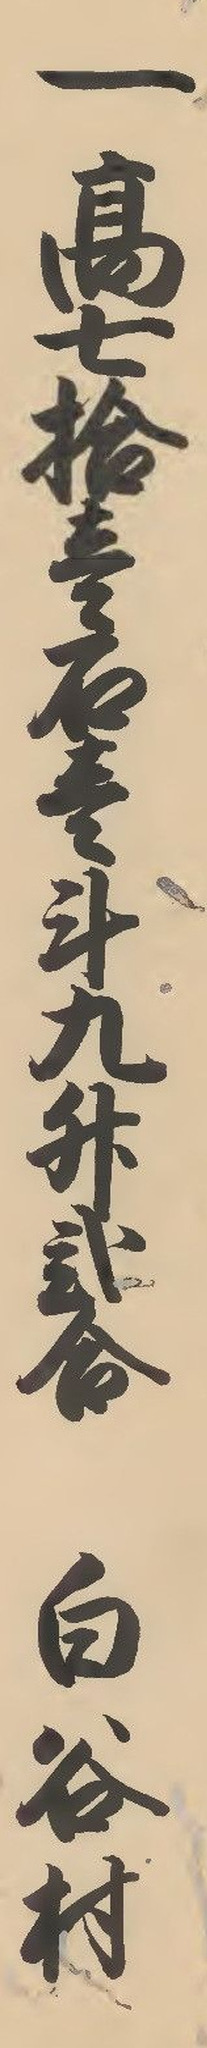一高七拾壱石壱斗九升弐合白谷村
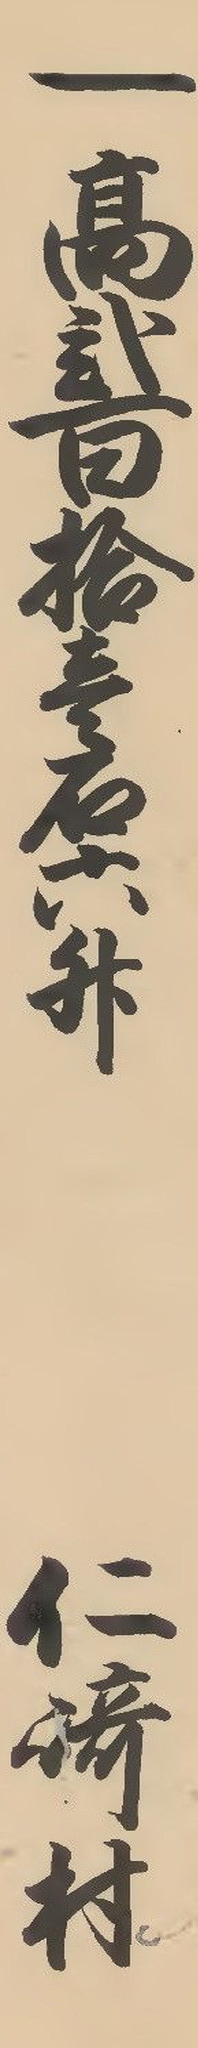一高弐百拾壱石六升仁崎村
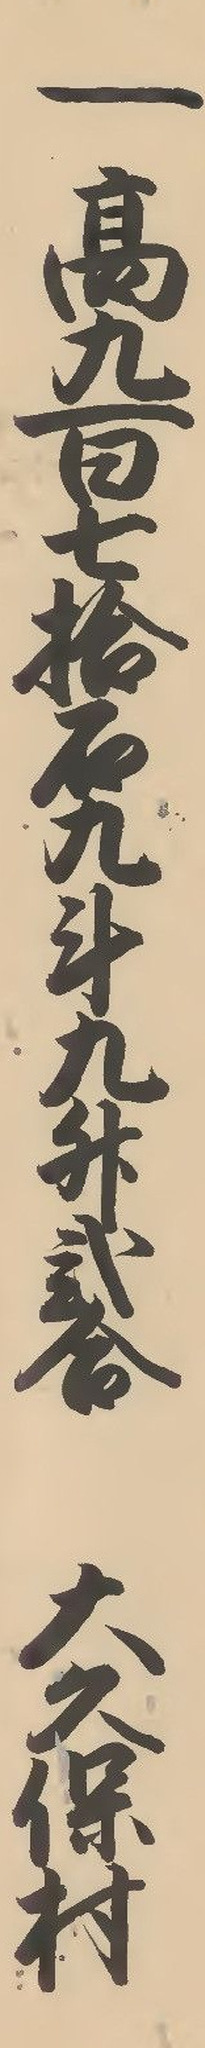一高九百七拾石九斗九升弐合大久保村
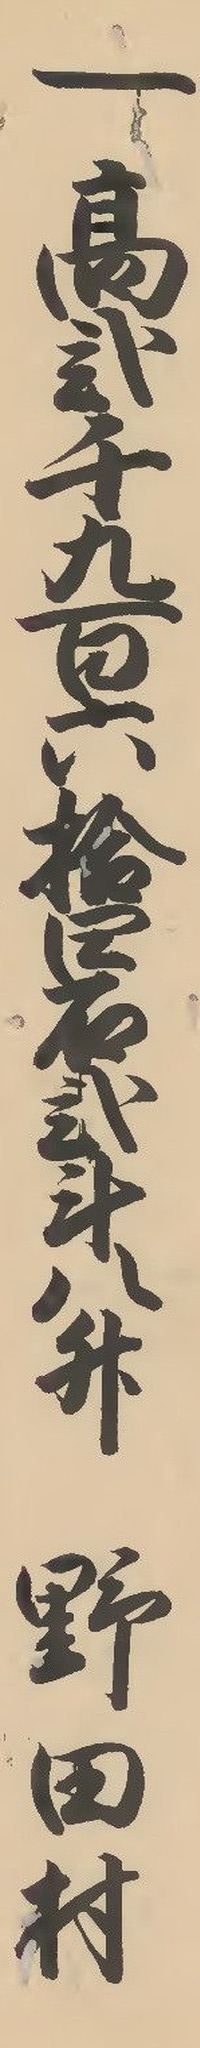一高弐千九百六拾四石弐斗八升野田村
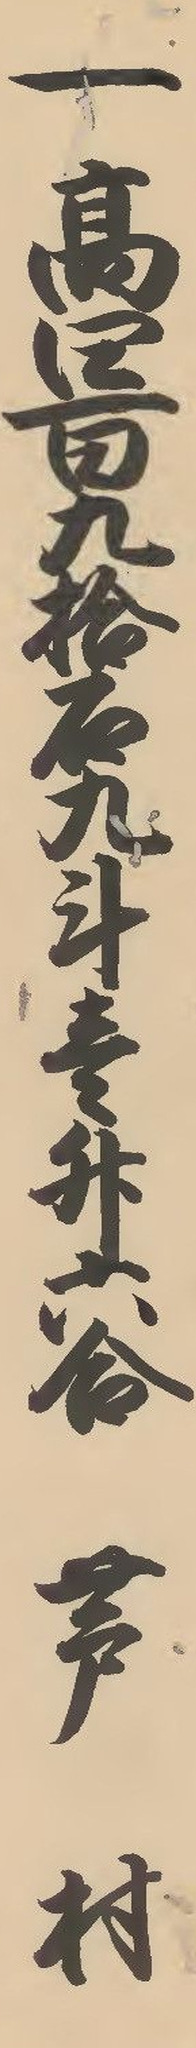一高四百九拾石九斗壱升六合芦村
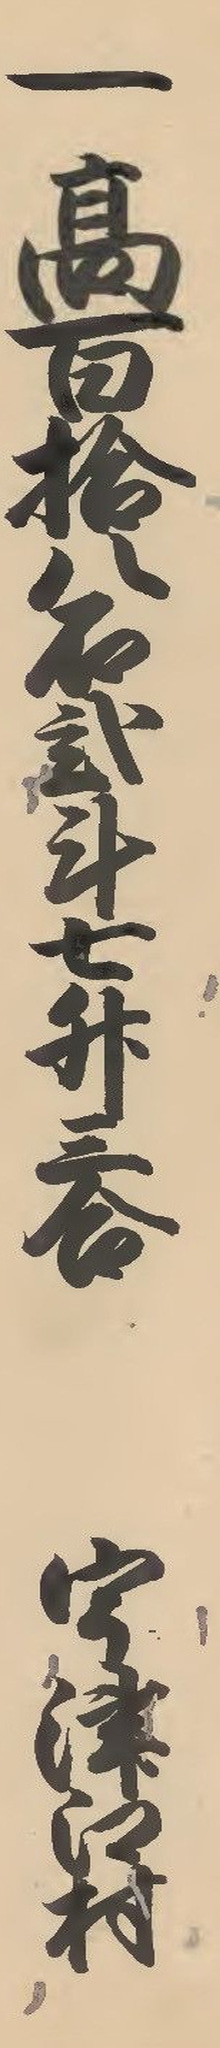一高百拾八石弐斗七升三合宇津江村
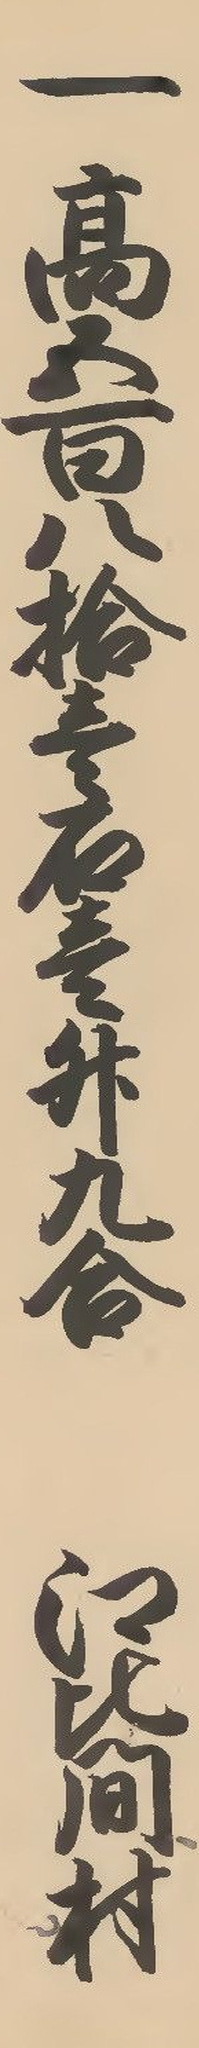一高五百八拾壱石壱升九合江比間村
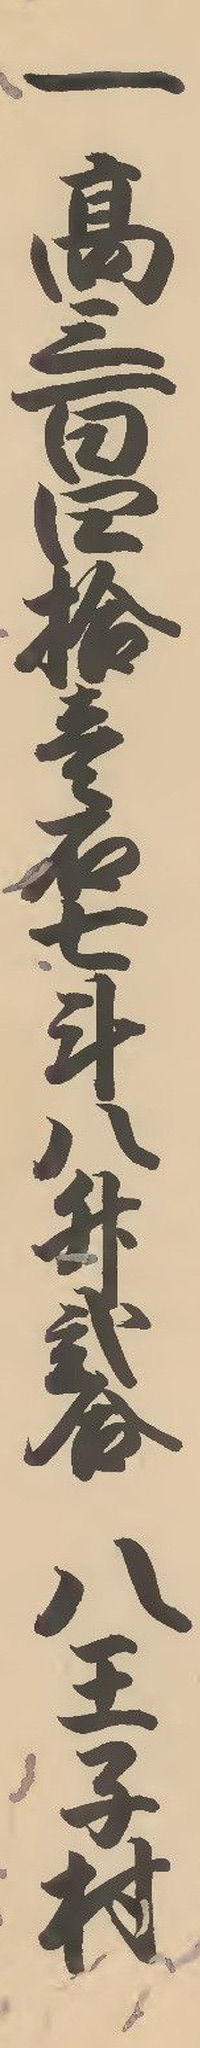一高三百四拾壱石七斗八升弐合八王子村

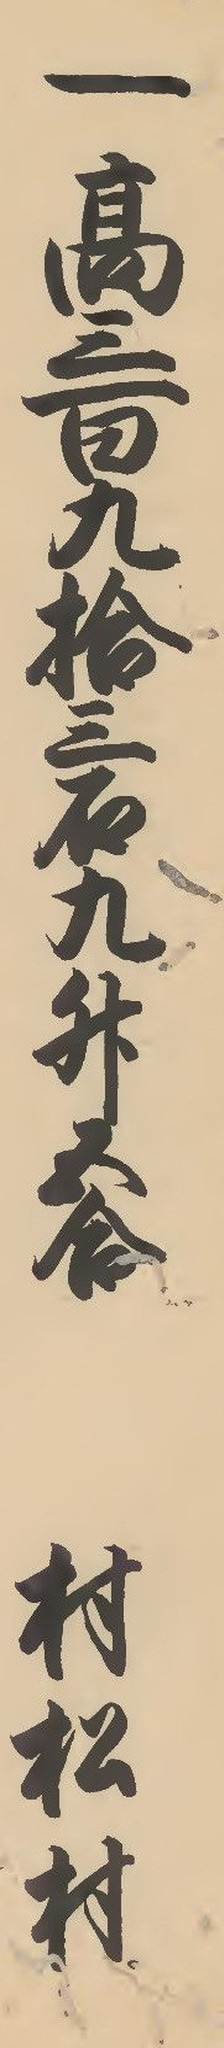一高三百九拾三石九升五合村松村
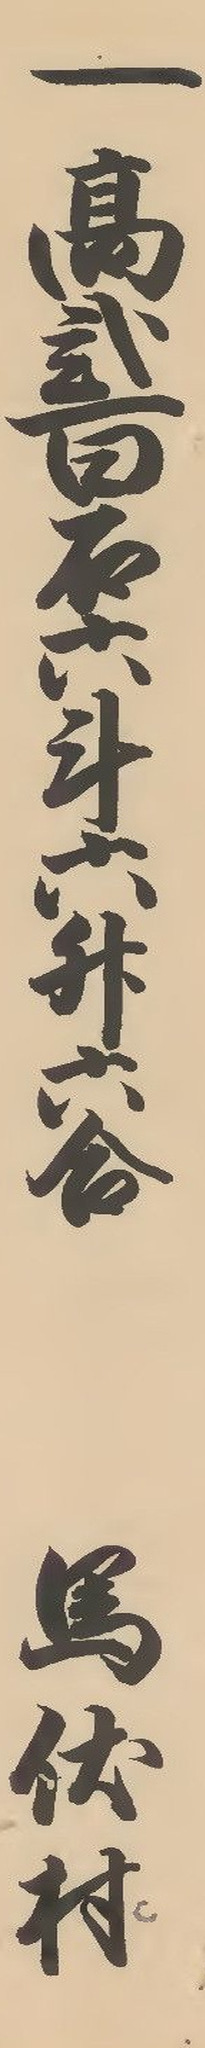一高弐百石六斗六升六合馬伏村
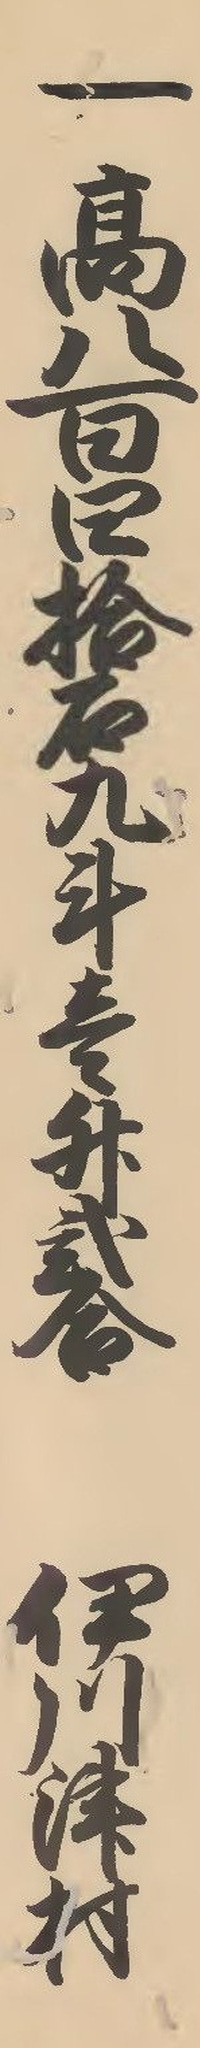一高八百四拾石九斗壱升弐合伊川津村
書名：三河国郷帳
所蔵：国立公文書館 National Archives of Japan
